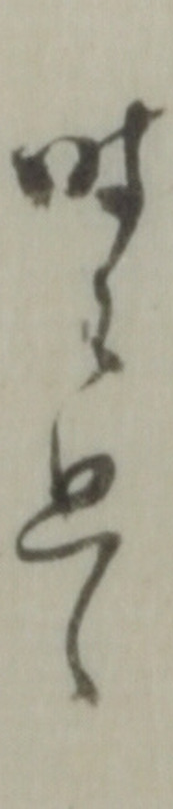時も廻候
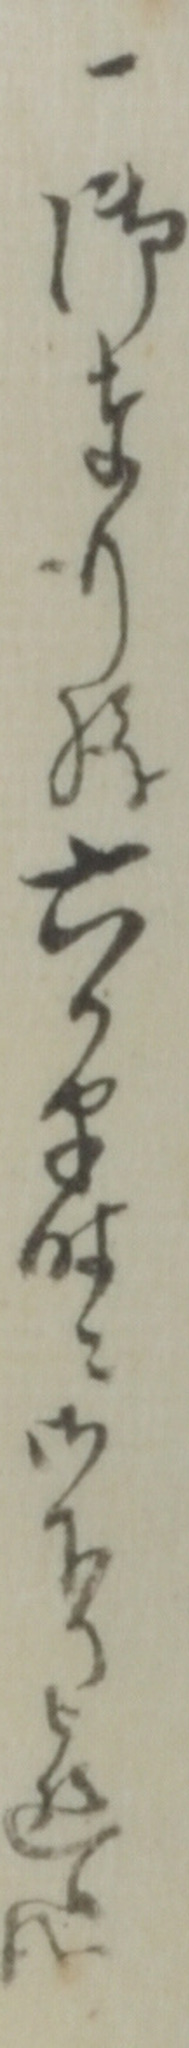一御奉行様六ツ半時ニ御下リ被遊候様

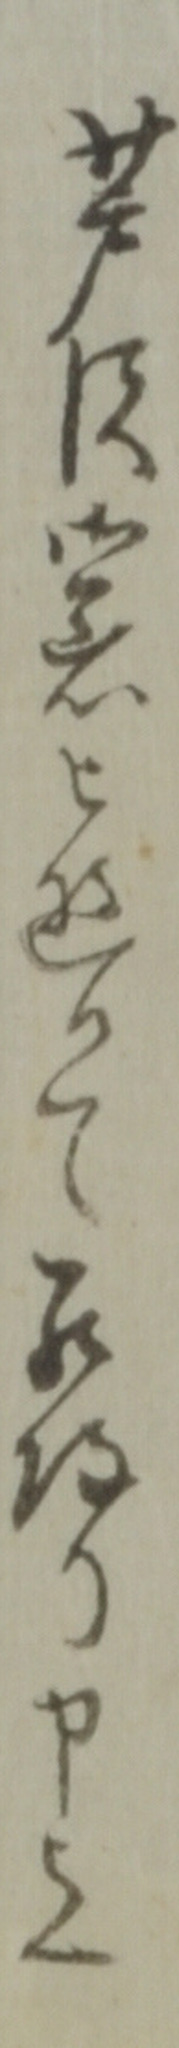芦沢御着被遊候ハヽ罷帰リ申立
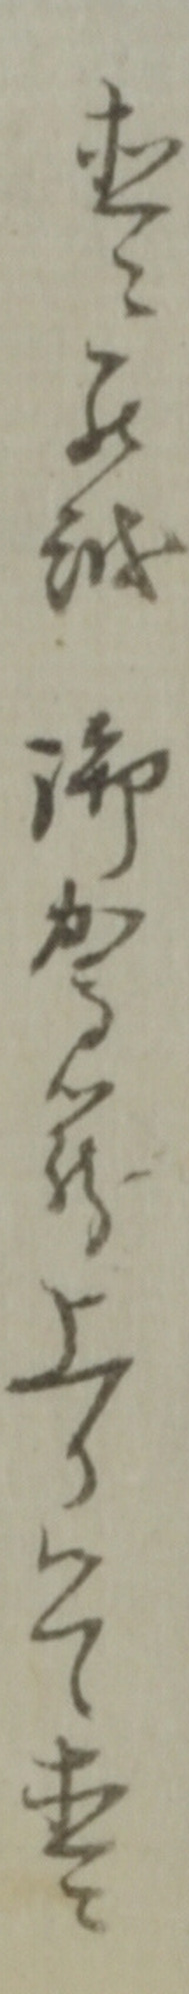直々罷越御駕籠上リ候ハヽ直々
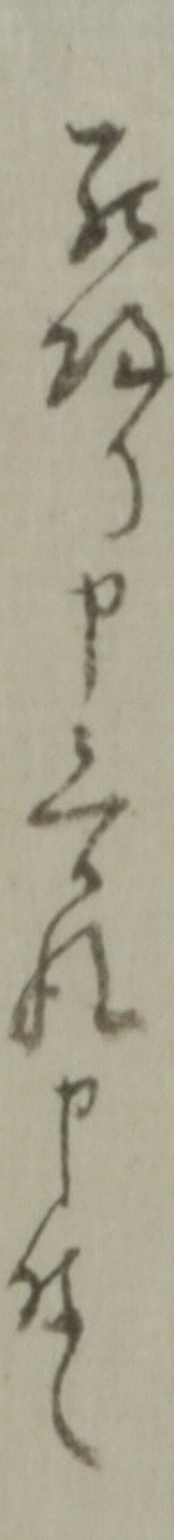罷帰リ申上候様申付候
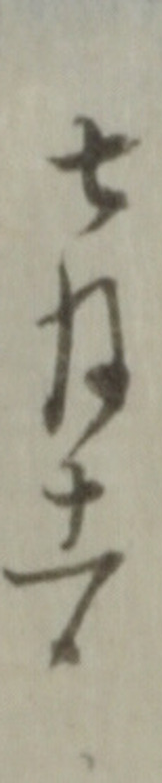七月十一日
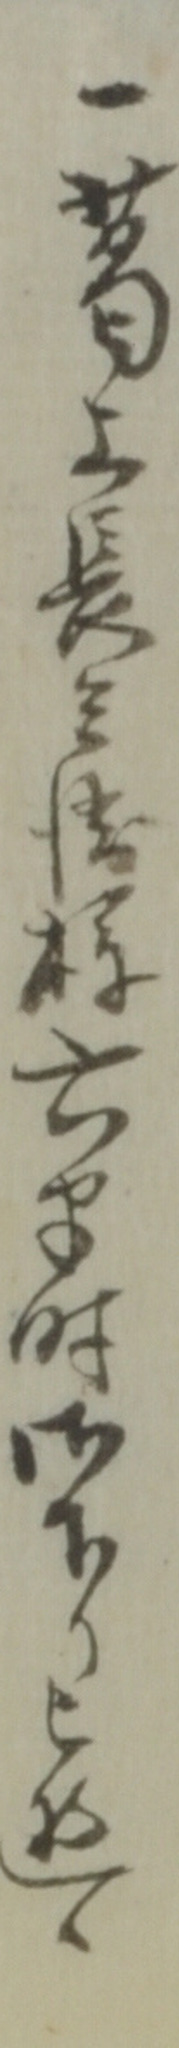一葛上長兵衛様六半時御下リ被遊候
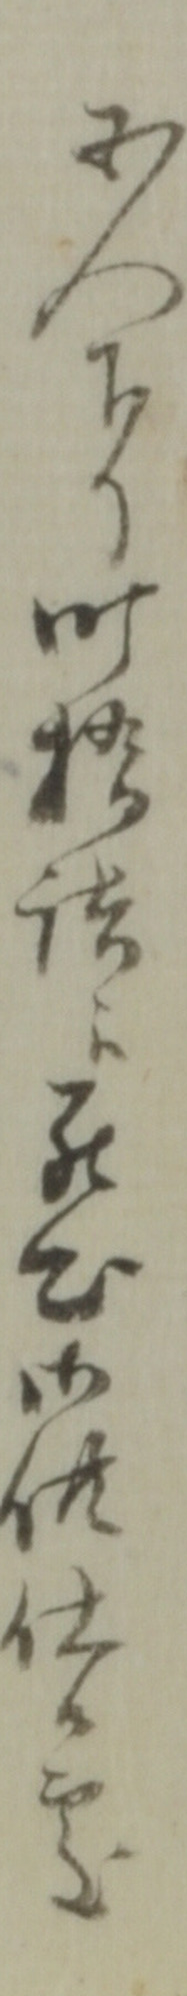五人下リ町橋詰江罷出御供仕候処
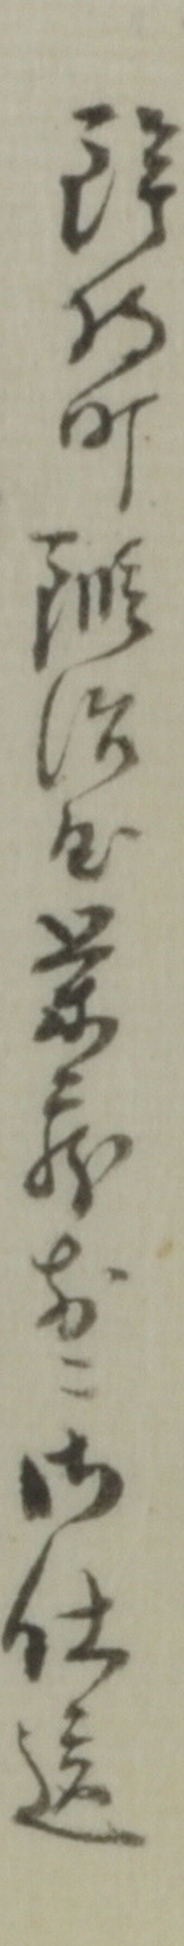鉾持町鍛冶屋栄蔵前ニ御仕送
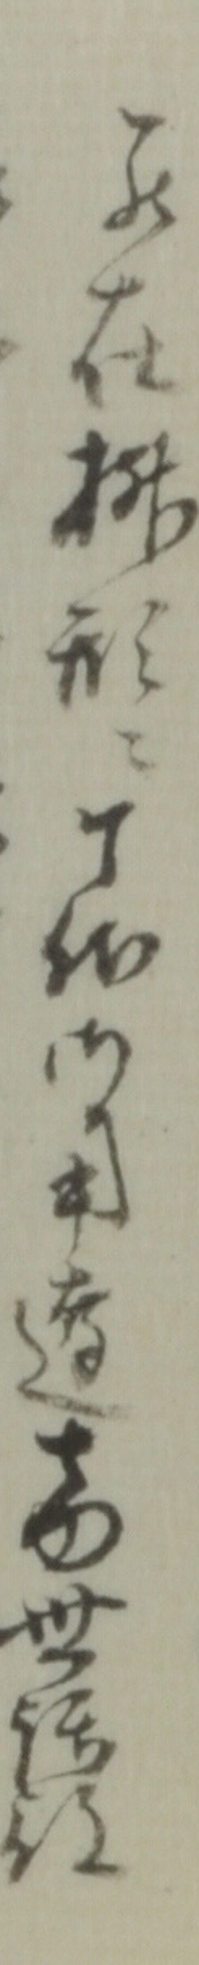罷在枡形ニ丁代御用達商世話役
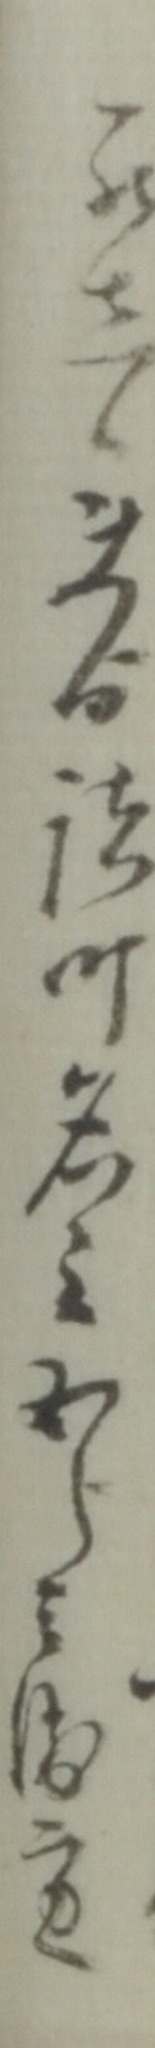罷在候夫ゟ諸町名主五郎兵衛方ヘ
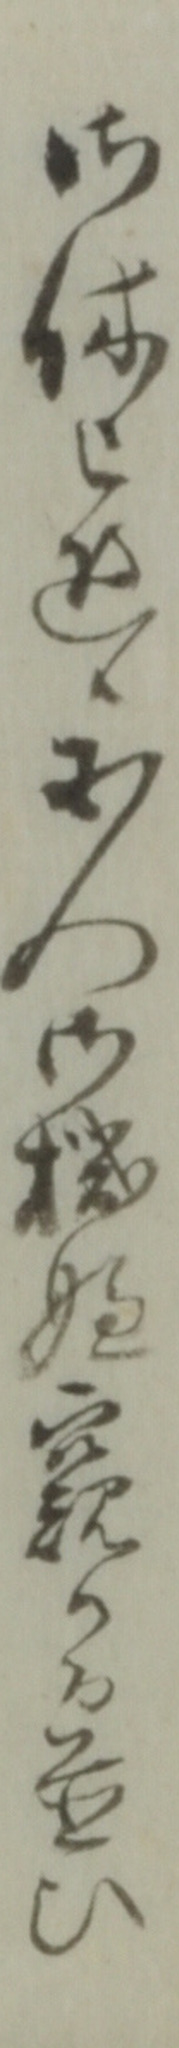御休被遊候五人御機嫌窺候而置比
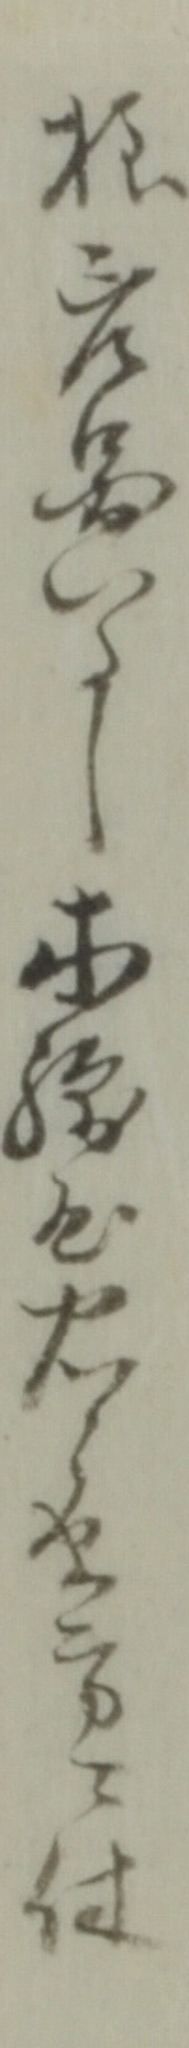様指図いたし木綿屋忠兵衛方ニ休
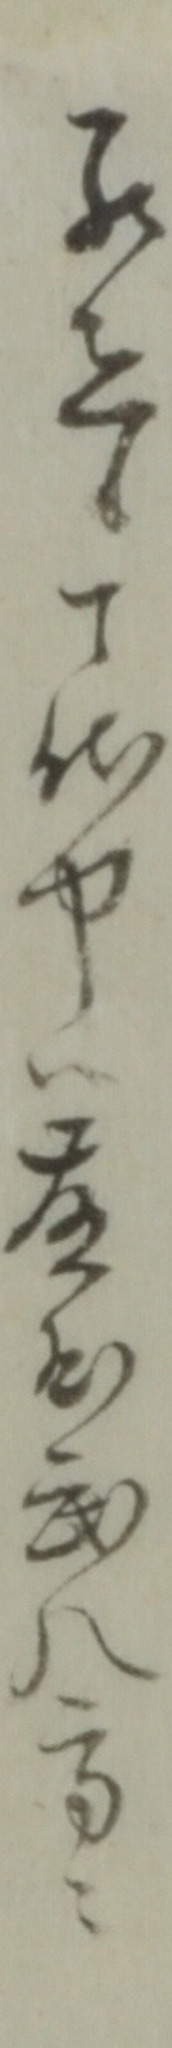罷在候丁代中ハ藤屋武八方ニ
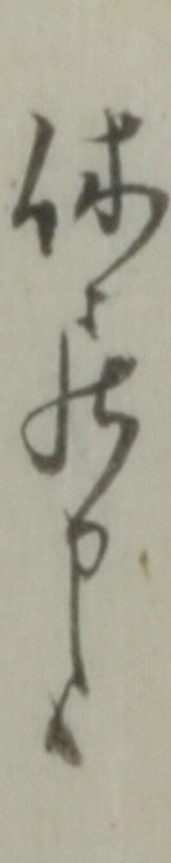休居申候
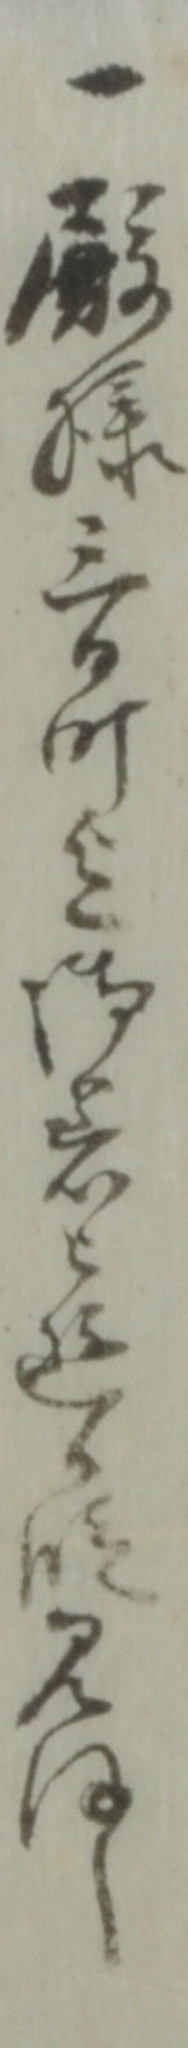一殿様三日町迄御着被遊候段見ほし
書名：御初入諸事控
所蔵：伊那市立高遠町図書館・合同会社AMANE
